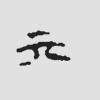亓（其）
